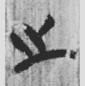之
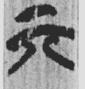亓
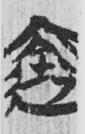䘳（襟）
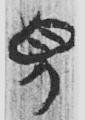見（現）
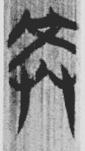○（樊→返）
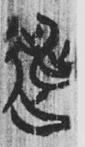逃
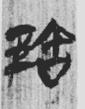珤
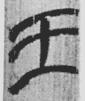王
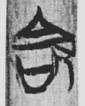命
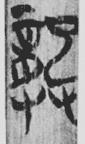龏（龔）
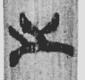之
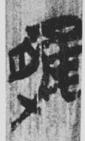○（脽）
